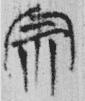宗
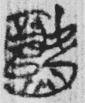○（噬）
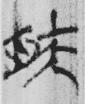肤（膚）
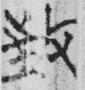○（往）
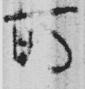可（何）
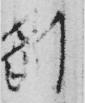咎
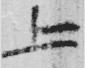上
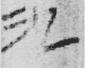九
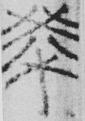楑（睽）
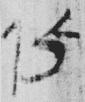○（孤）
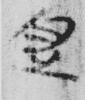見
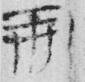豕
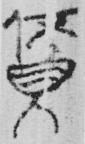○（負）
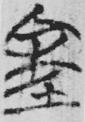○（塗）
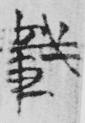載
